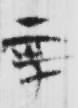辛
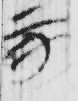亥
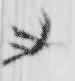之
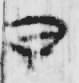日
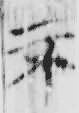不
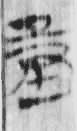量
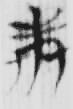奉
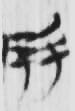阩
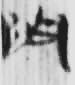門
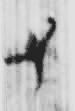又
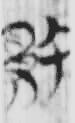敗
